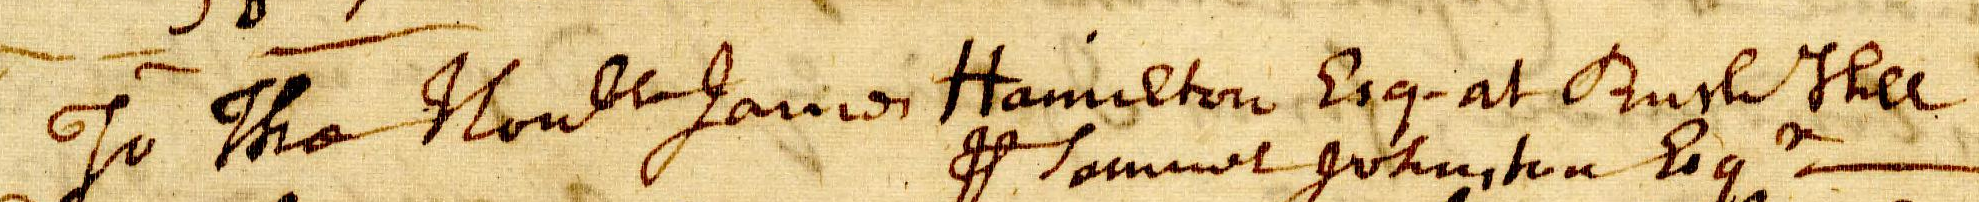To The Hon^ble James Hamilton Esq- at Bush Hill
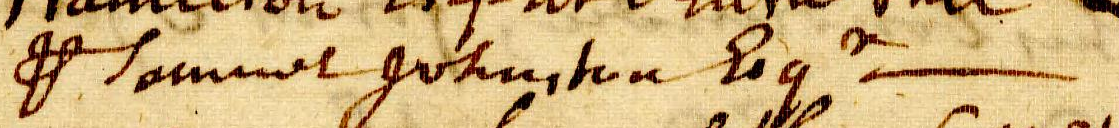per Samuel Johnston Esq^r-
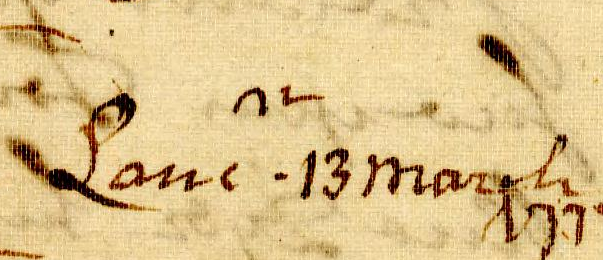Lanc^er. 13 March
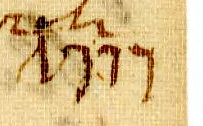1777
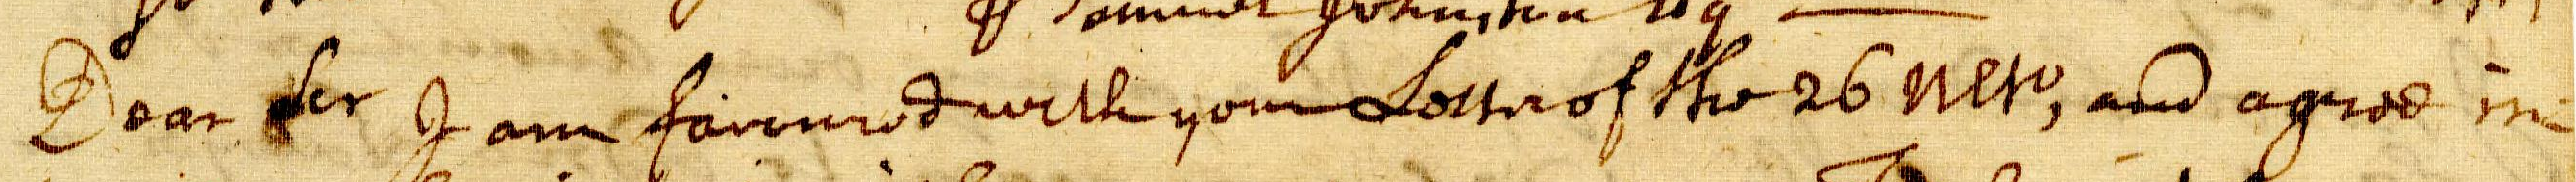Dear Sir I am favoured with your Letter of the 26 Ult^o, and again in
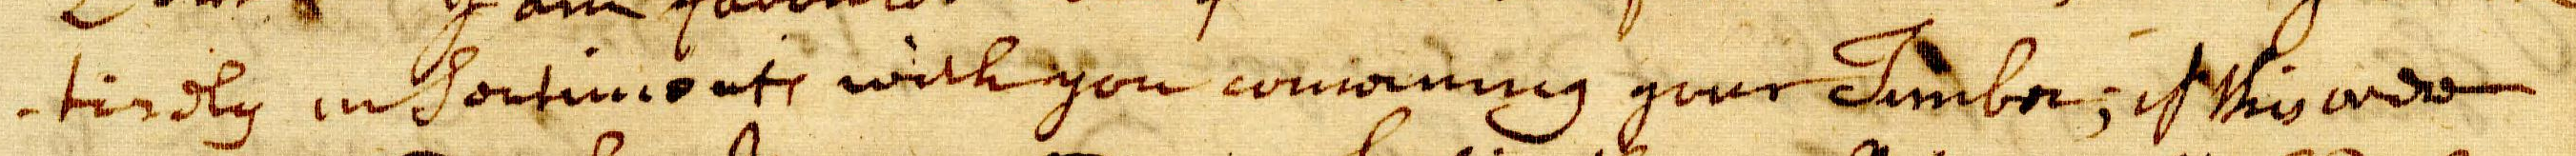-tirely in Sentiments with you concerning your Timber; if this were
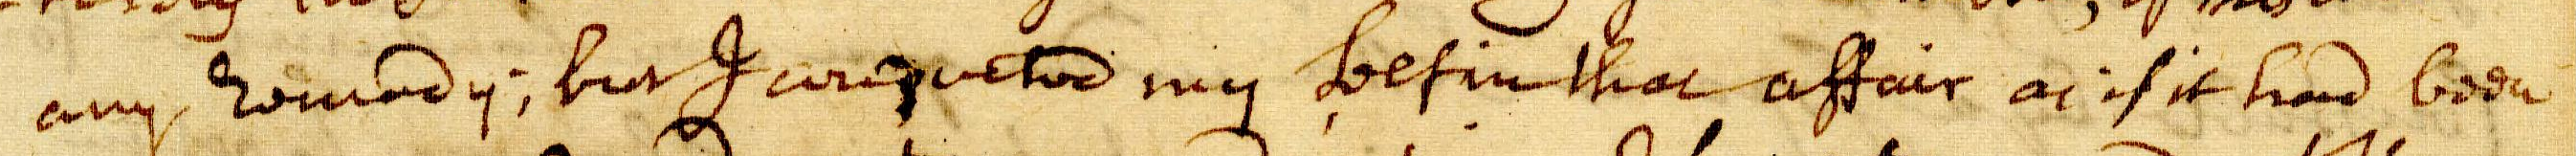any remedy, bur I conducted my Self in that affair as if it had been
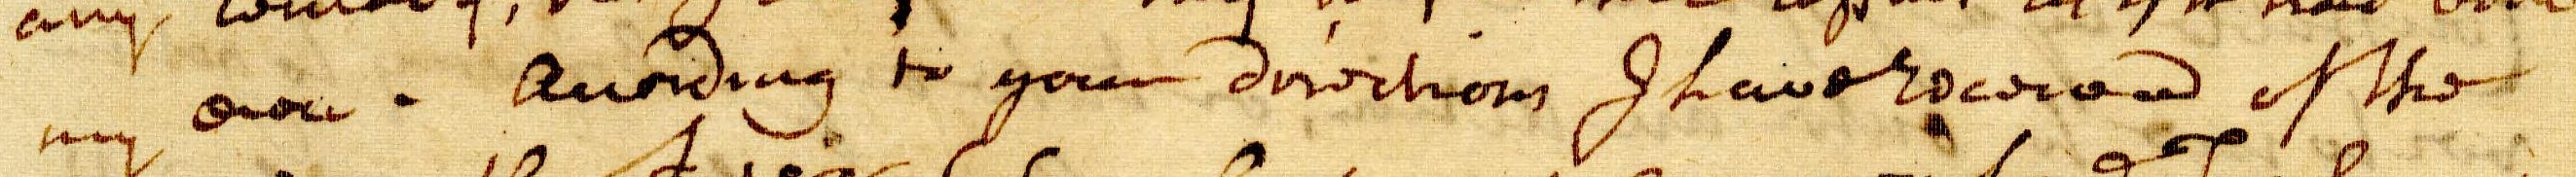my own- According to your directions I have received of the
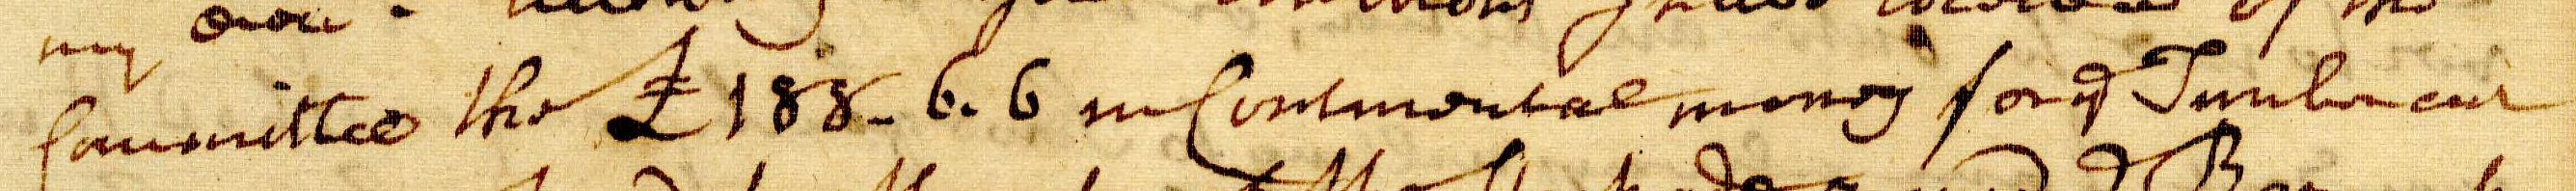Committee the £188,,6,6 in Continental money for y^e Timber cut
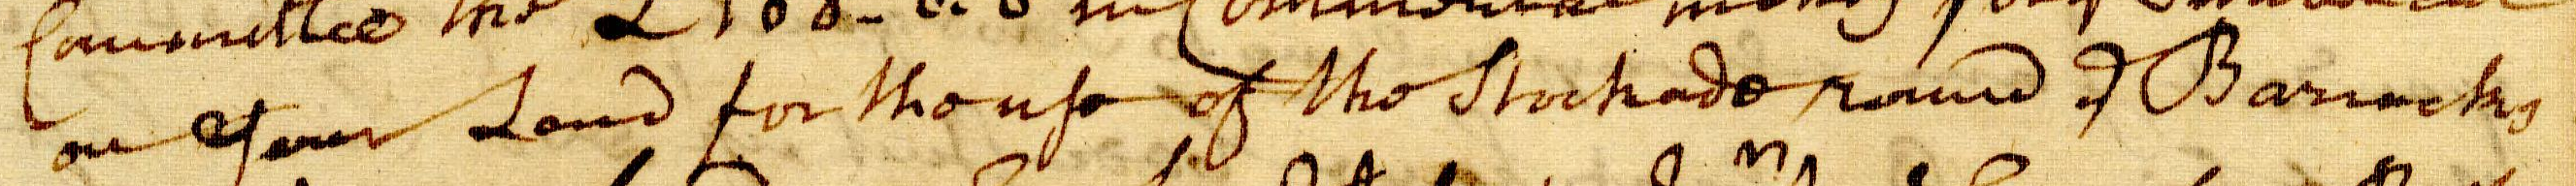on your Laud for the use of the Stockade round y^ Barracks
